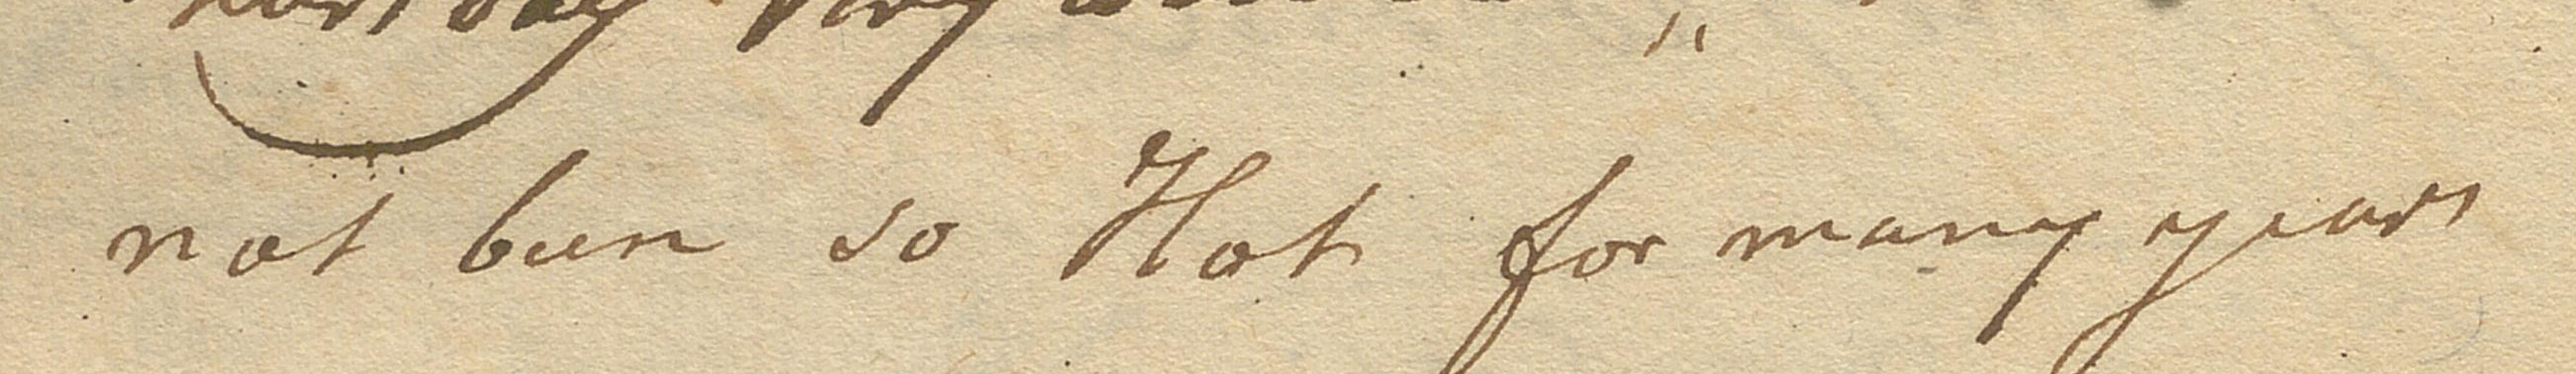not been so Hot for many years
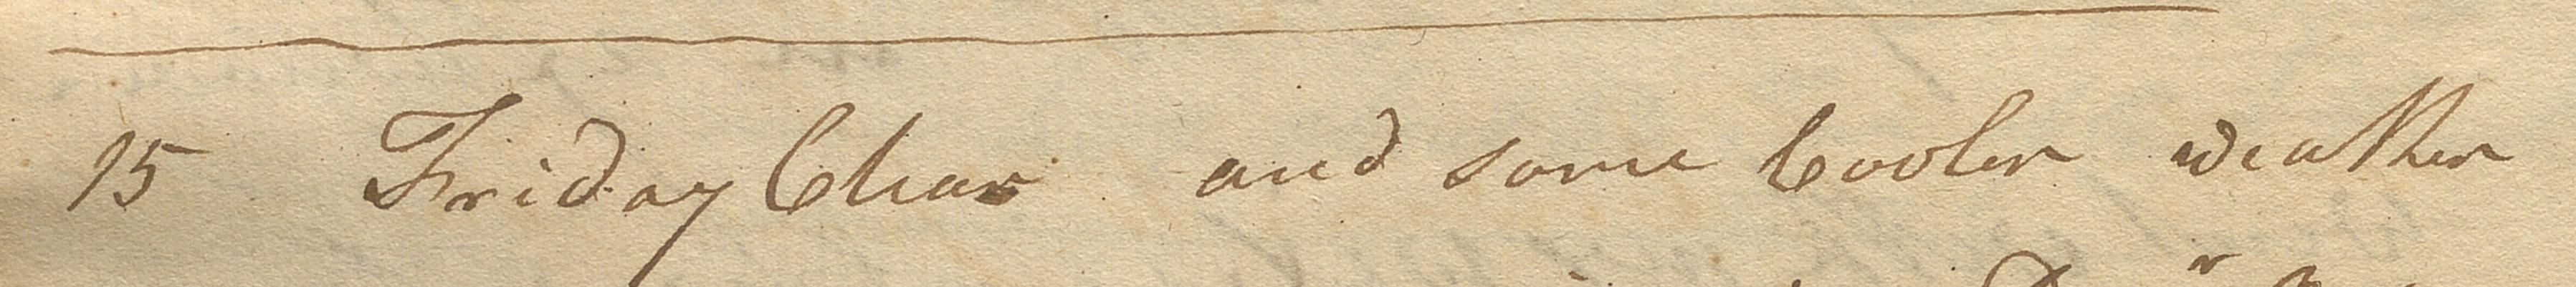15 Friday Clear and some Cooler weather
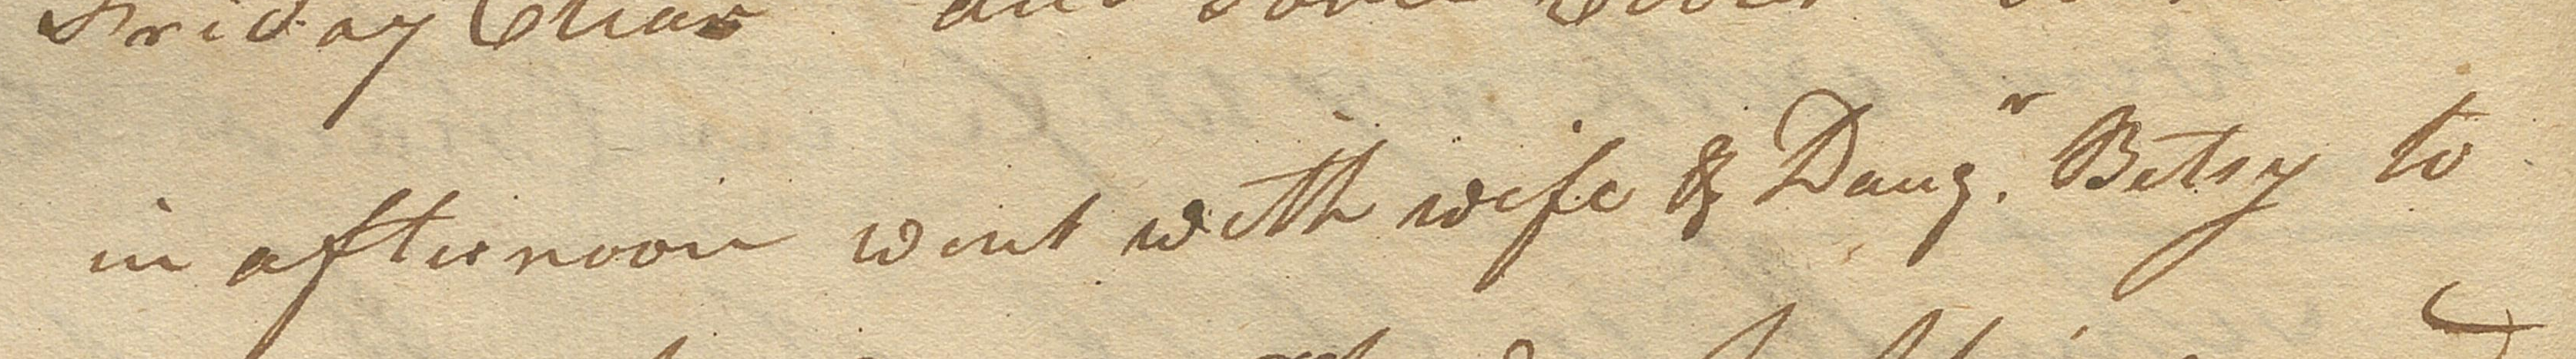in afternoon went with wife & Daug^r. Betsy to
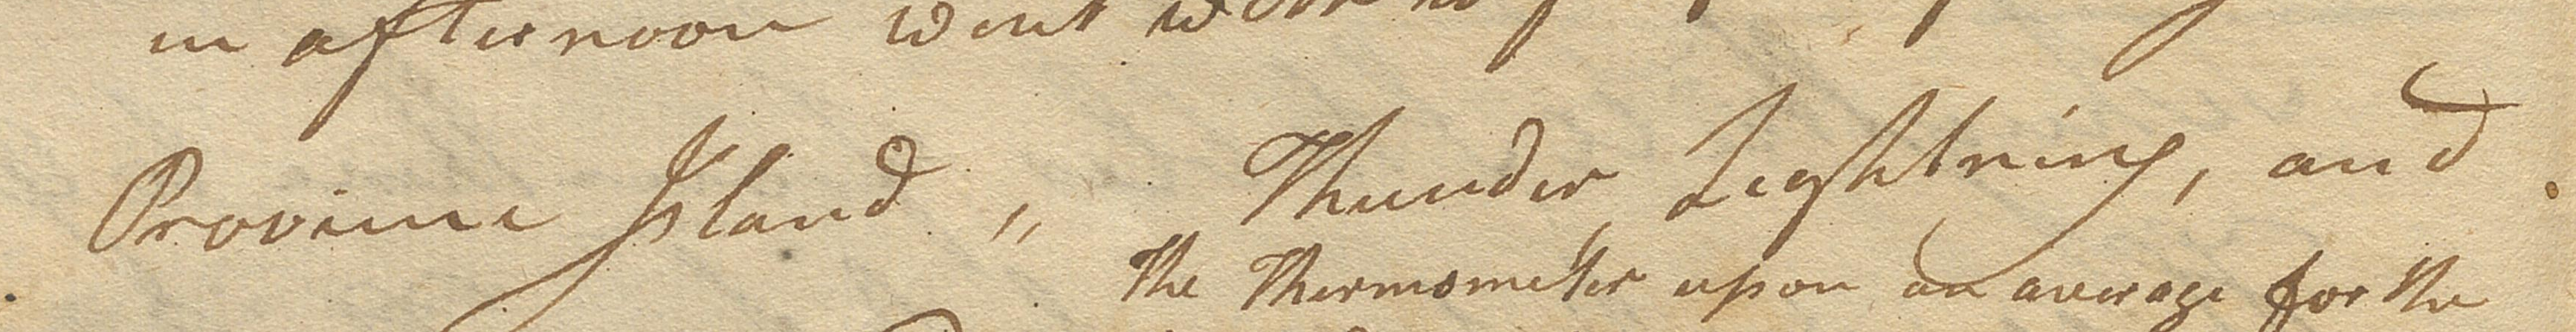Province Island, Thunder Lightning, and
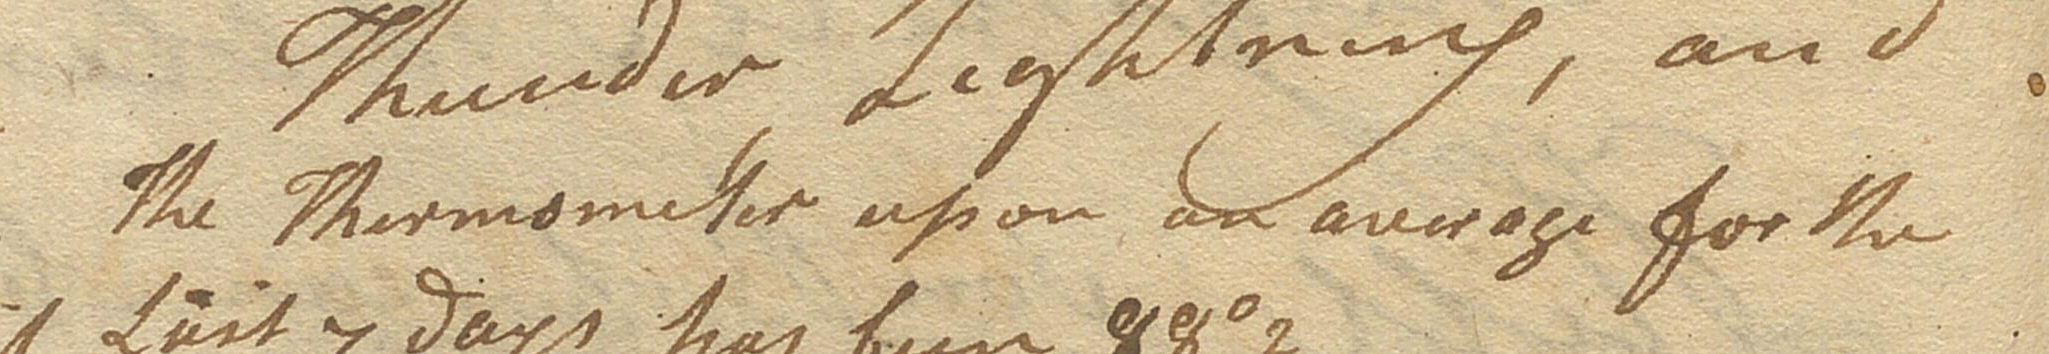The Thermometer upon an a average for the
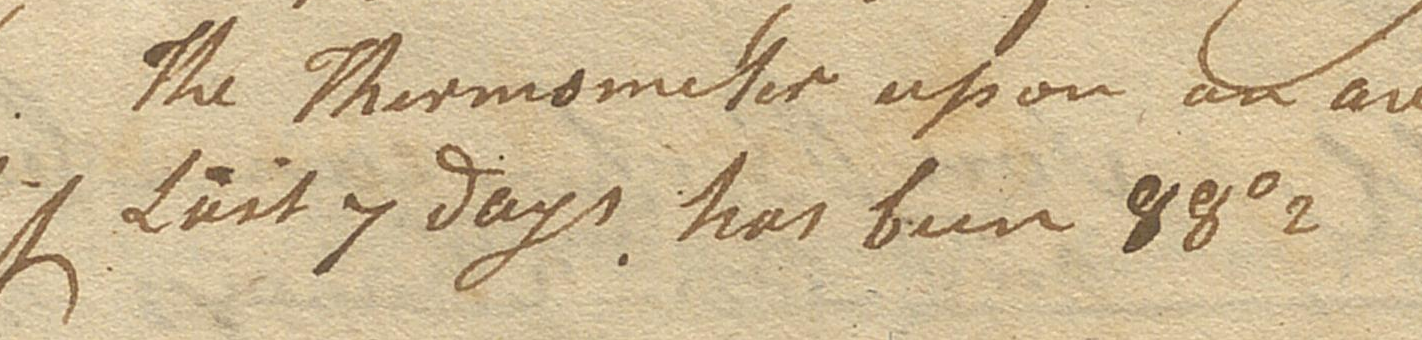Last 7 days has been 88°2
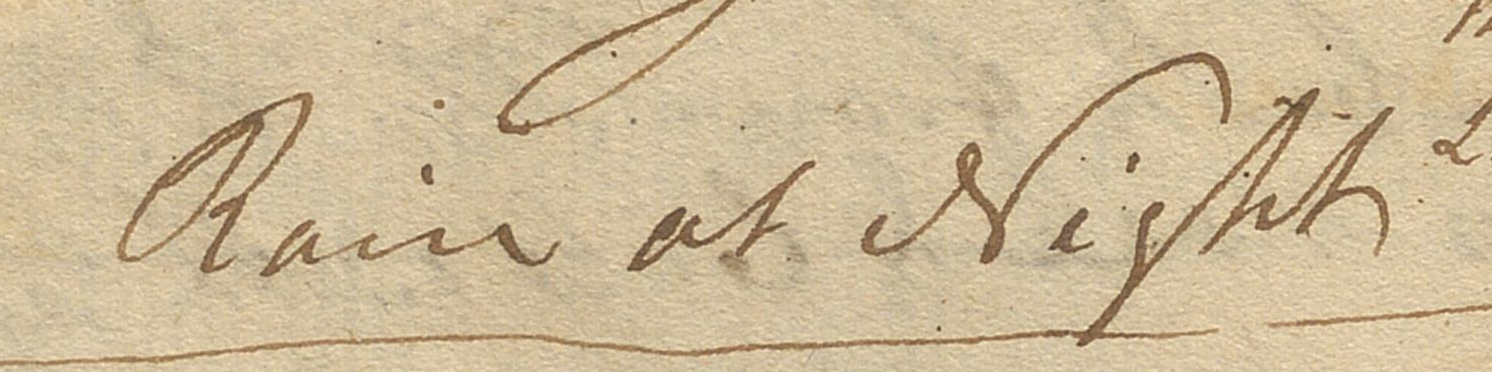Rain at Night
